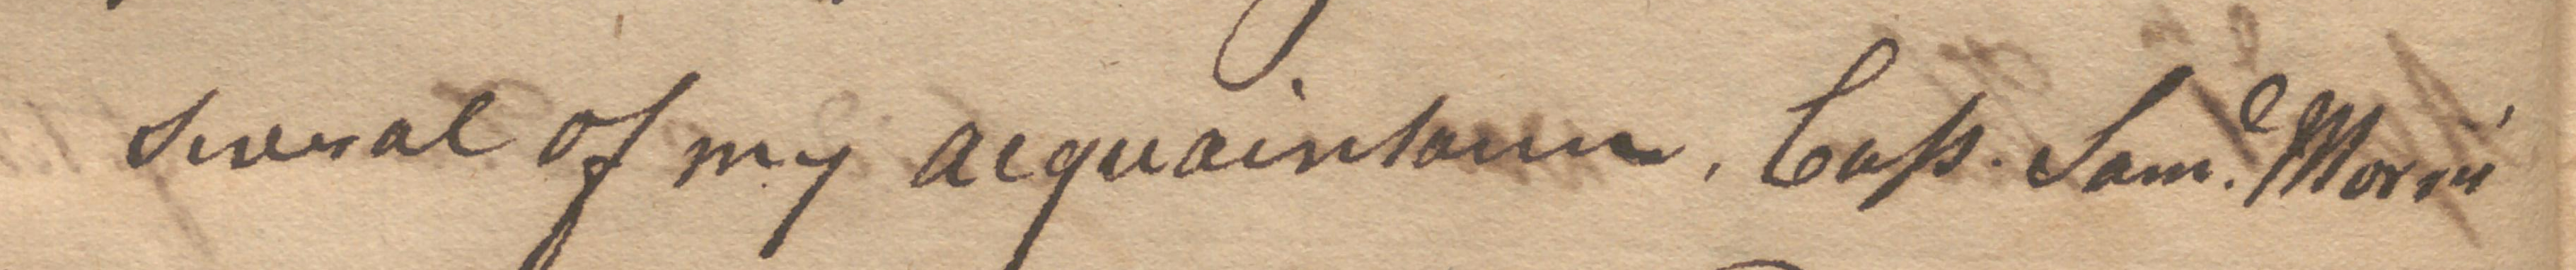several of my acquaintance, Cap. Sam^l. Morris
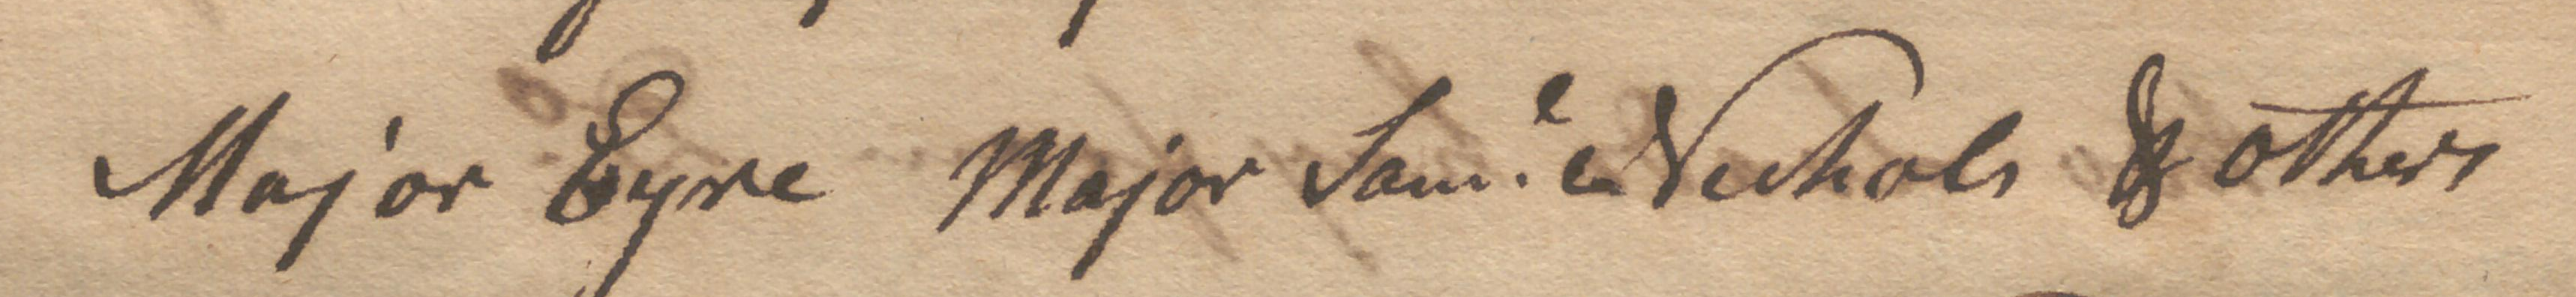Major Eyre Major Sam^l. Nichols & others
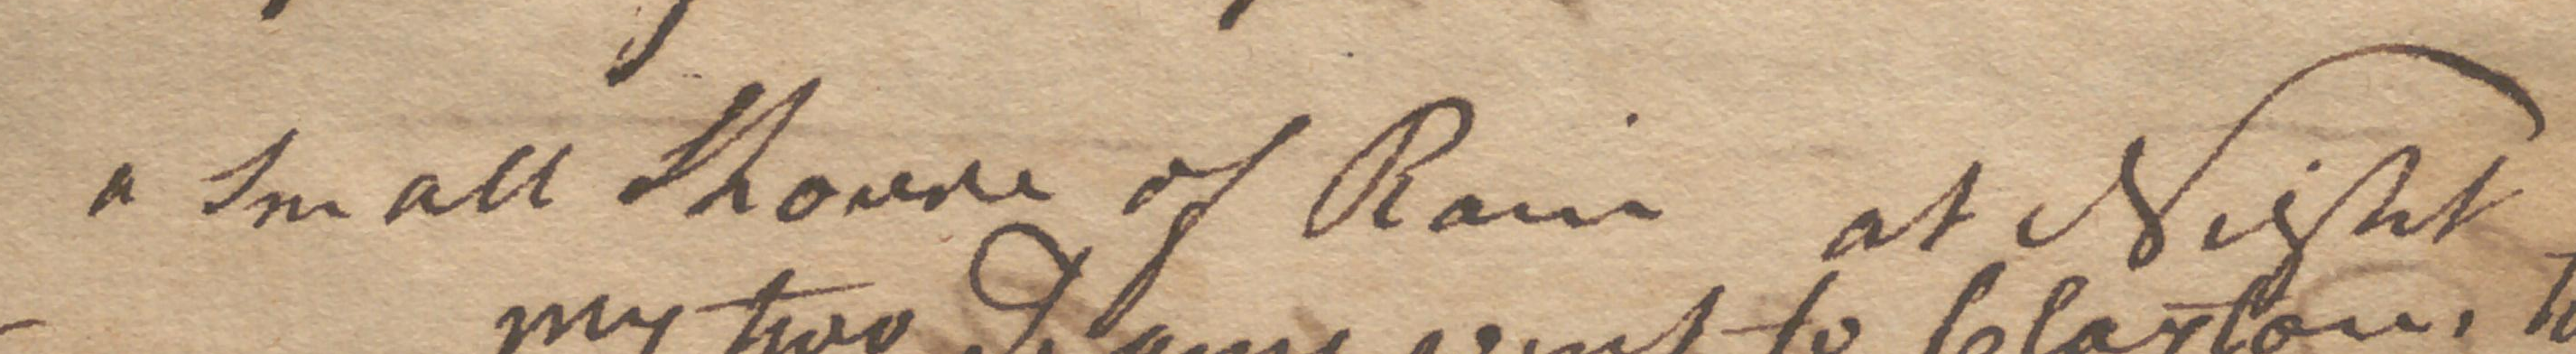a small Shoure of Rain at Night
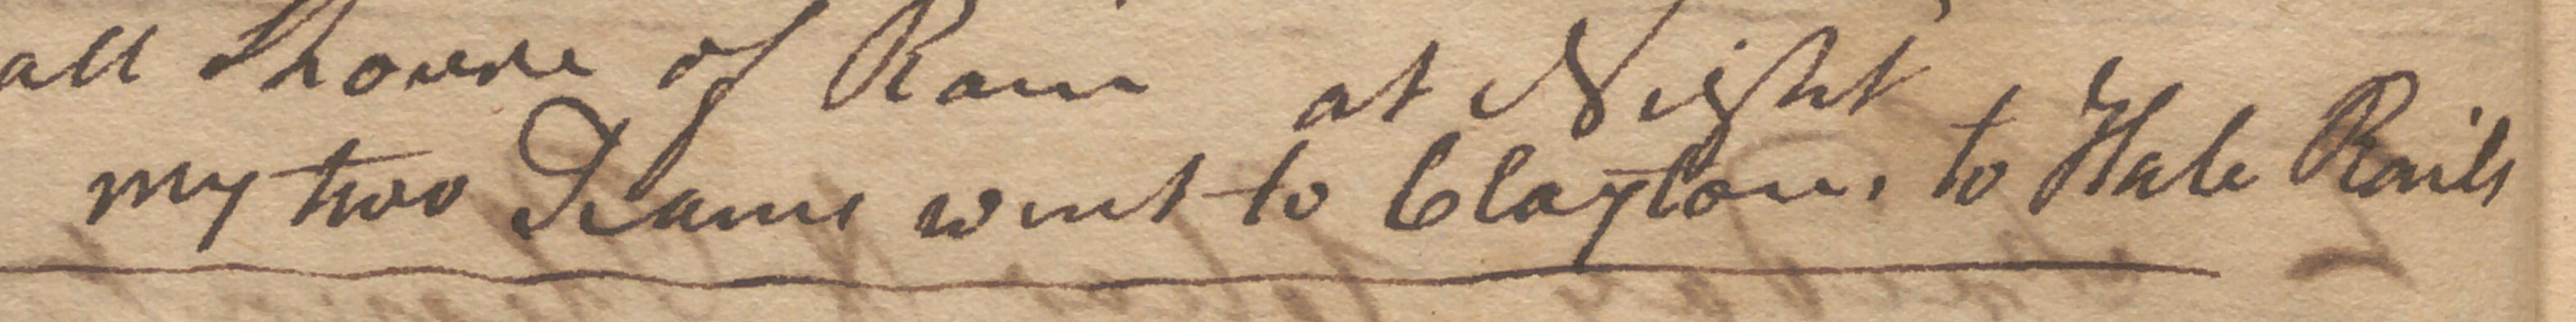my two Teams went to Claytons to Hale Rails
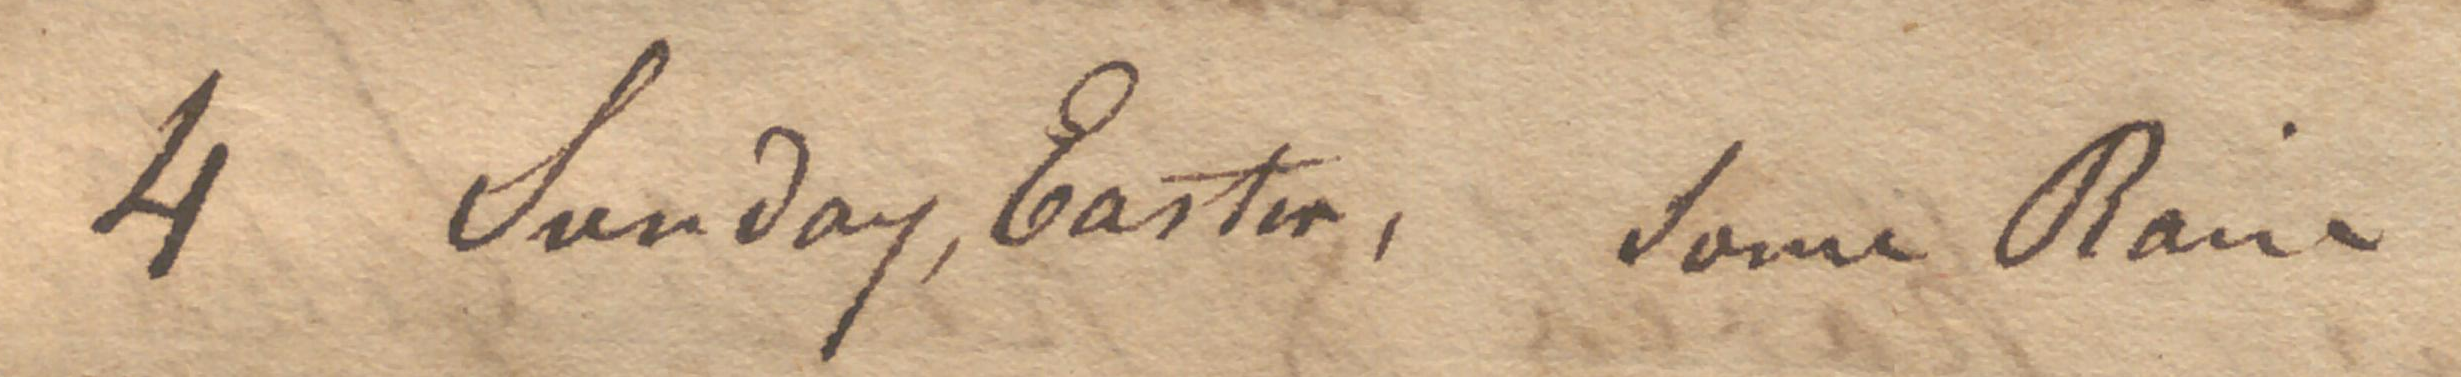4 Sunday Easter, Some Rain
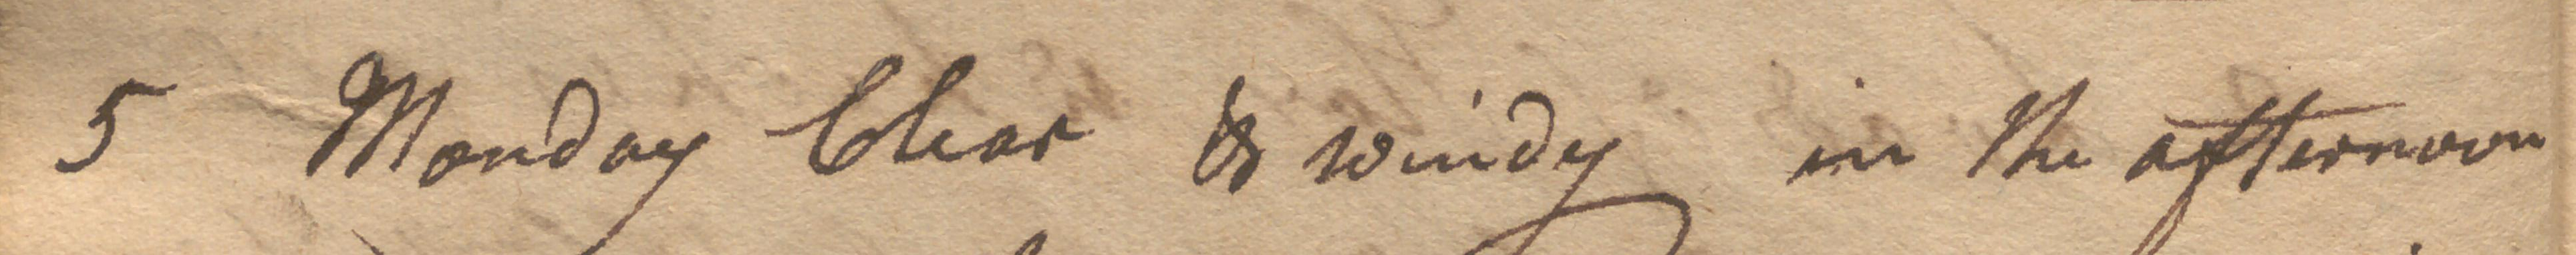5 Monday Clear & windy in the afternoon
